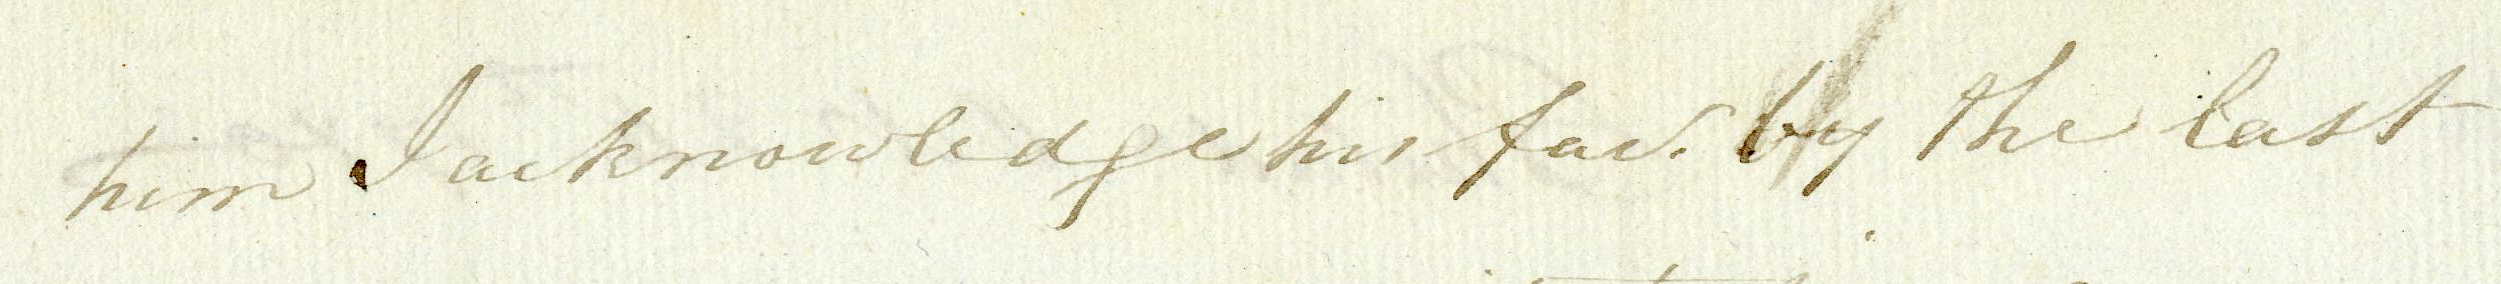him I acknowledge his fav^r. by the last
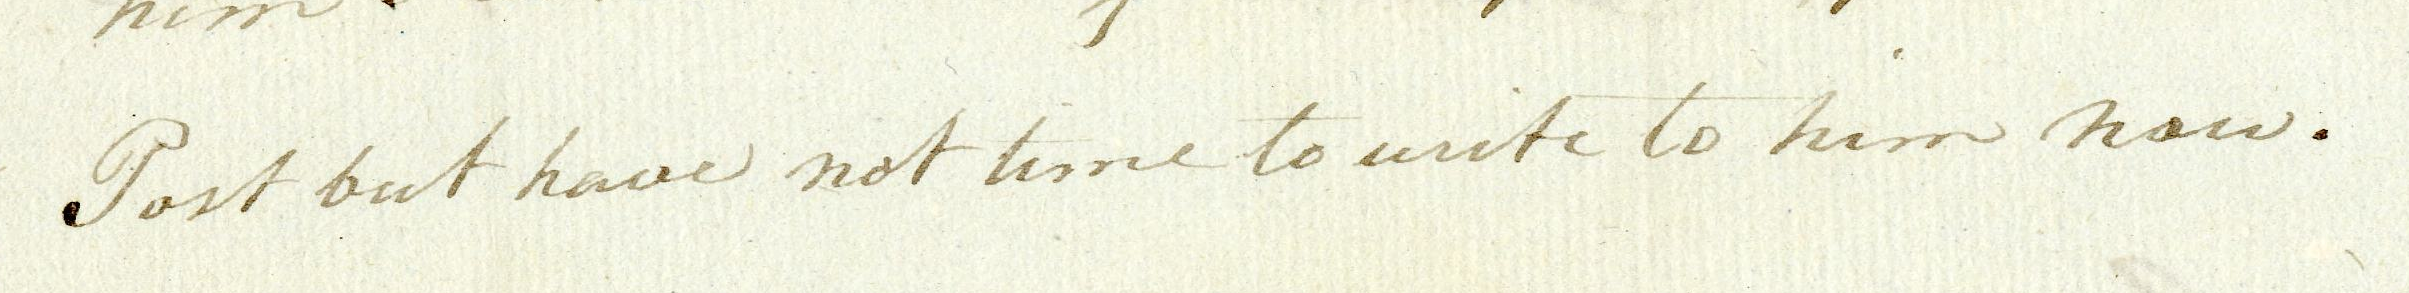Post but have not time to write to him now.
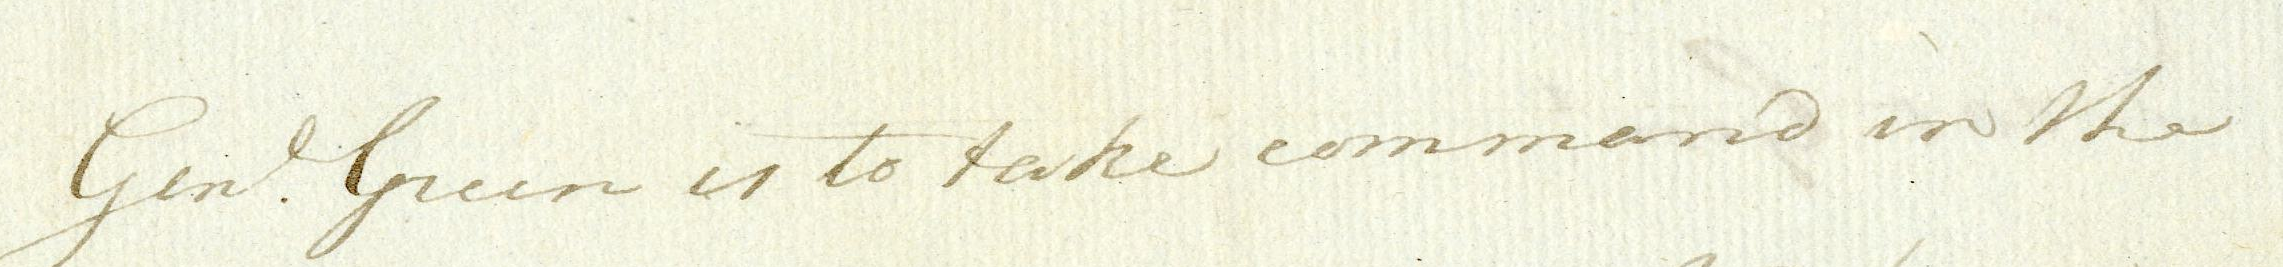Gen^l. Green is to take command in the
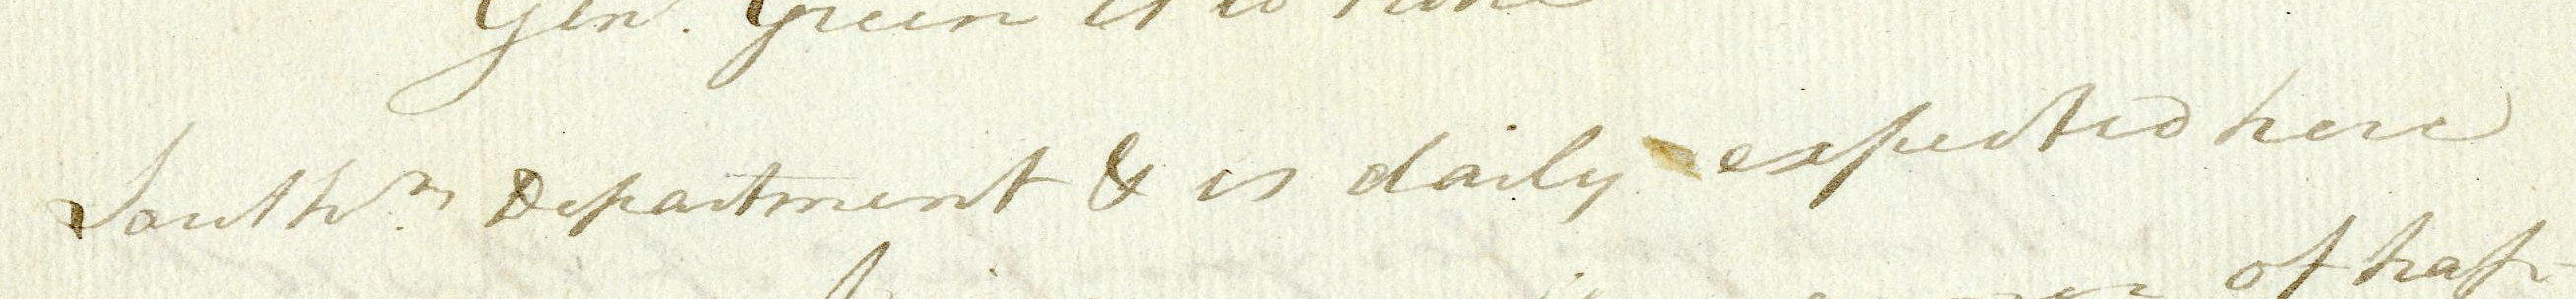South^n. Department & is daily expected here
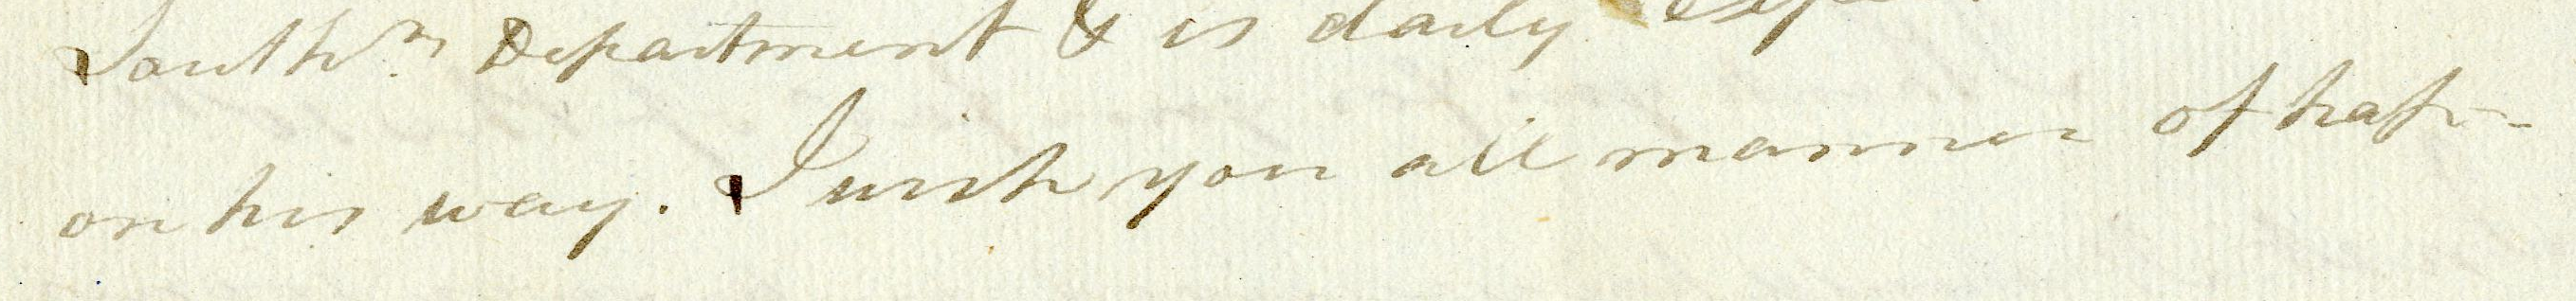on his way. I wish you all manner of hap-
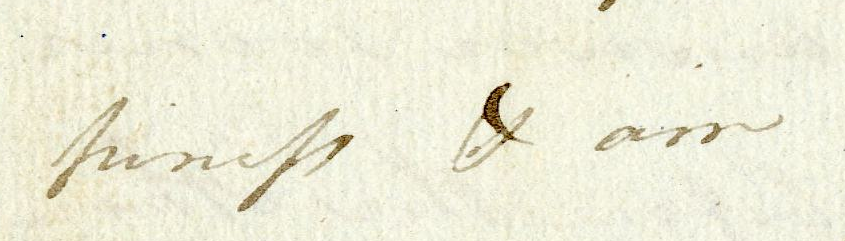piness & am
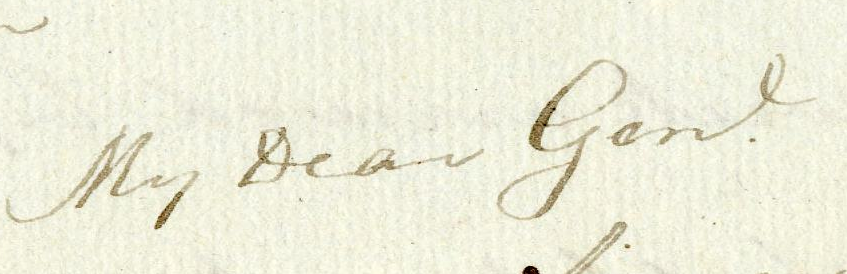My Dear Gen^l.
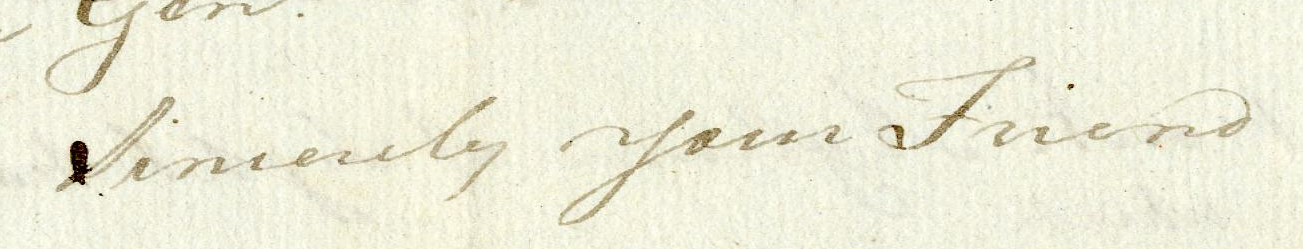Sincerely your Friend
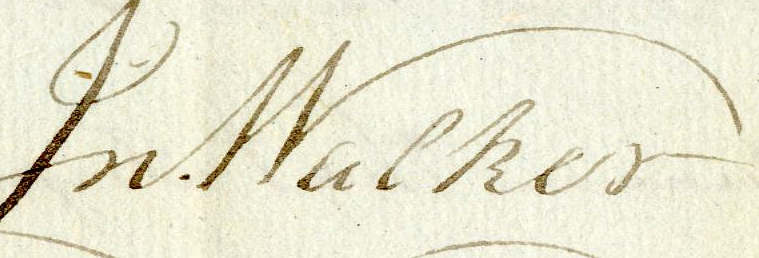Jn. Walker
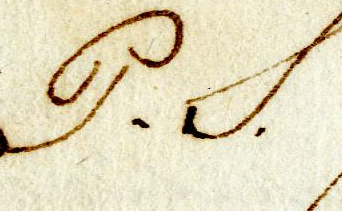P.S.
